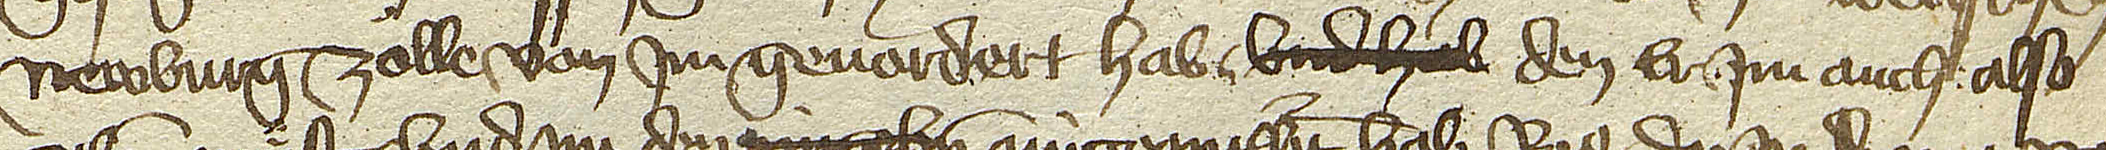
Newburg cʒölle von Im geuordert hab / vnd hab den Er Im auch alſo
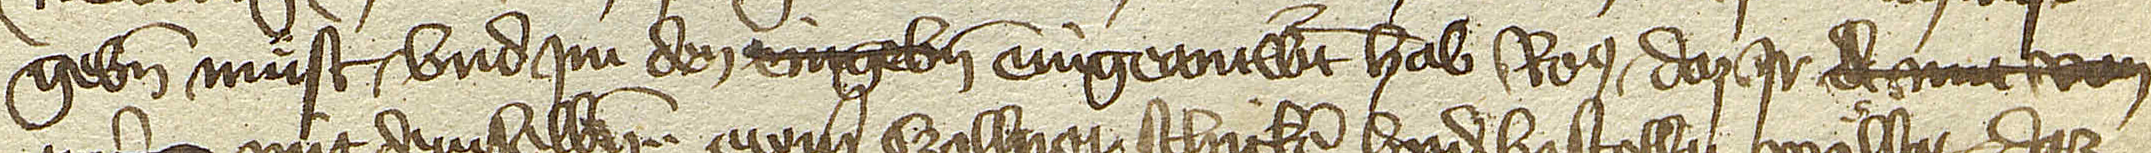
gebn* müſt / vnd Im den eingebn* eingeantwt* hab Ro* / daʒ ir d* mit von
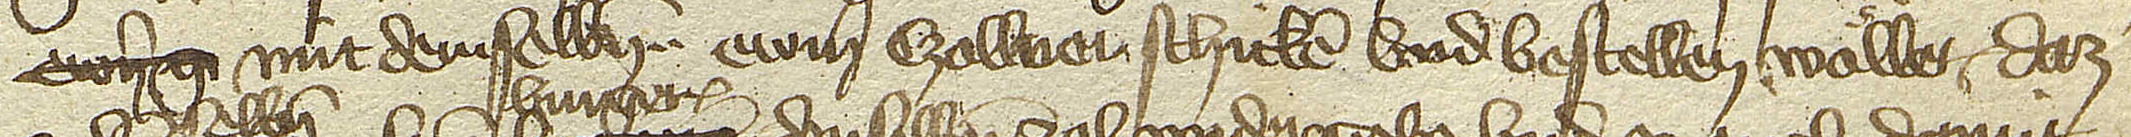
ewn* g* mit demſelbn* ~ ewm* Cʒollner ſchicke* vnd beſtellen wöllet / daʒ
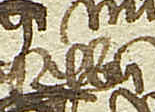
ſelbn*
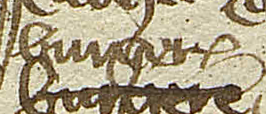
burger*
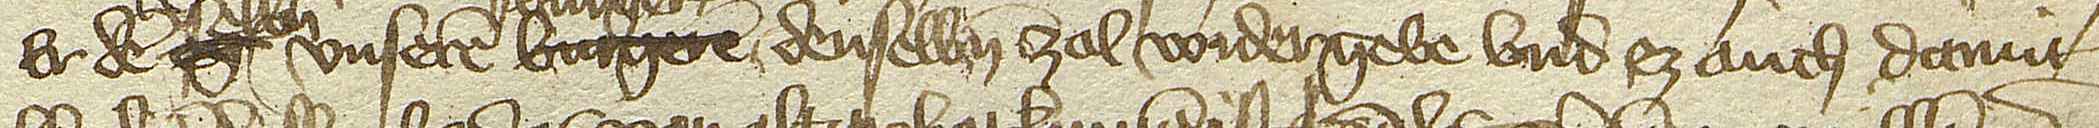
Er de* eg* vnſere* burgere* denſelbn* cʒol widergebe vnd eʒ auch damit
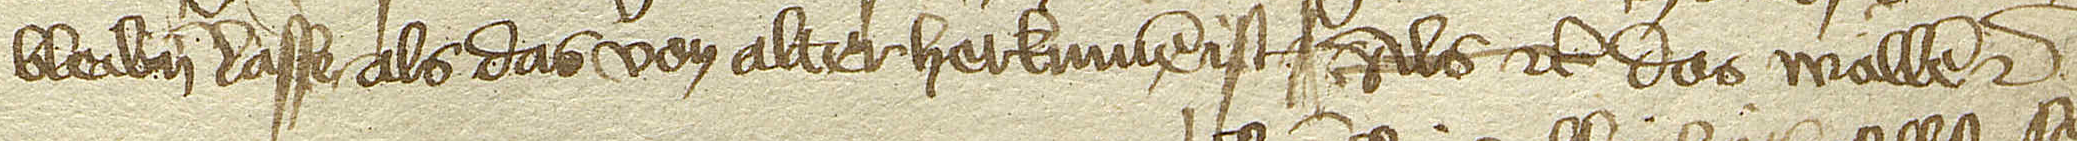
bleibn* laſſe / als das von alter herkume* iſt / Als ec* das wölle* ec*
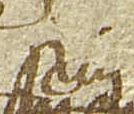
ſein
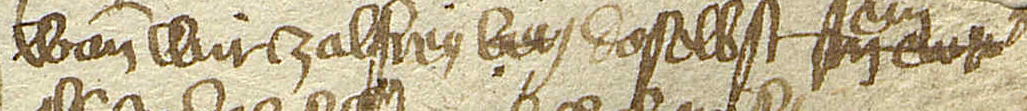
wan* wir cʒolfrey %%% doſelbſt in ewr*
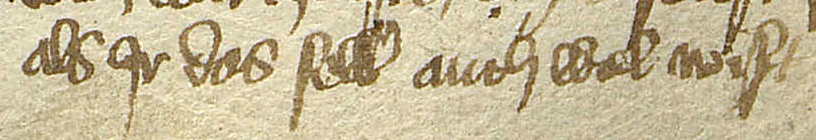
als Ir das ſelb* auch wol wiſt
